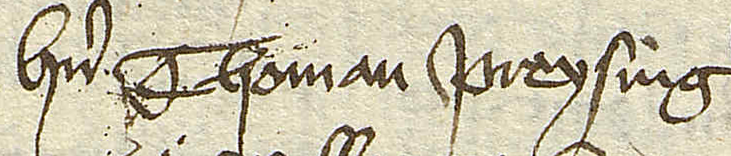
hn* Thoman Preyſing*
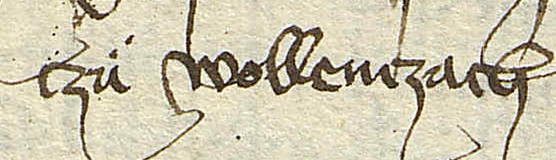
cʒü wollencʒach
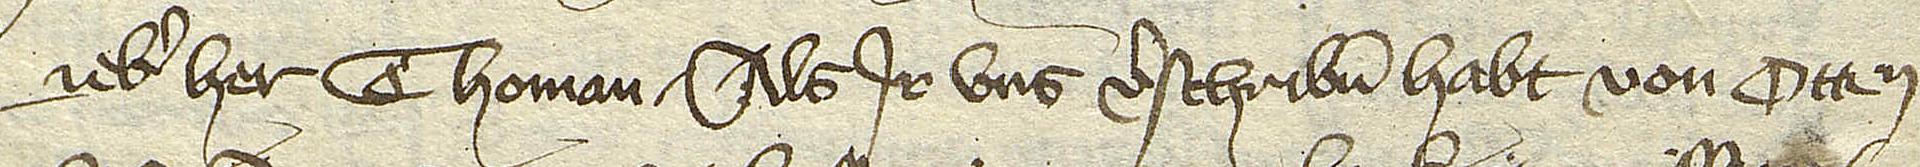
Lieb* her Thoman / Als Ir vns v*ſchribn* habt von Otten
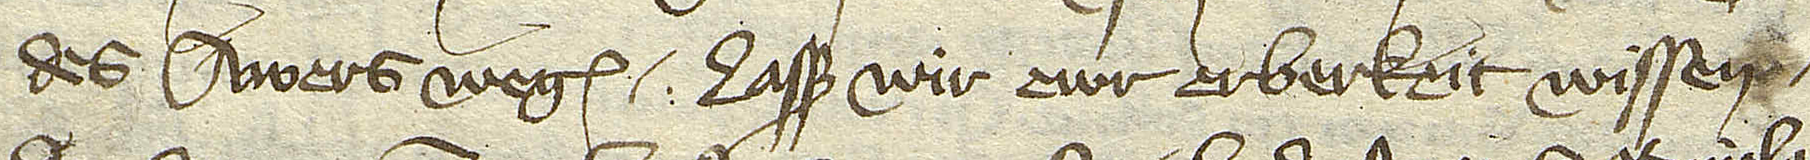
des Awers weg* / . Laſſ* wir ewr erberkeit wiſſen /
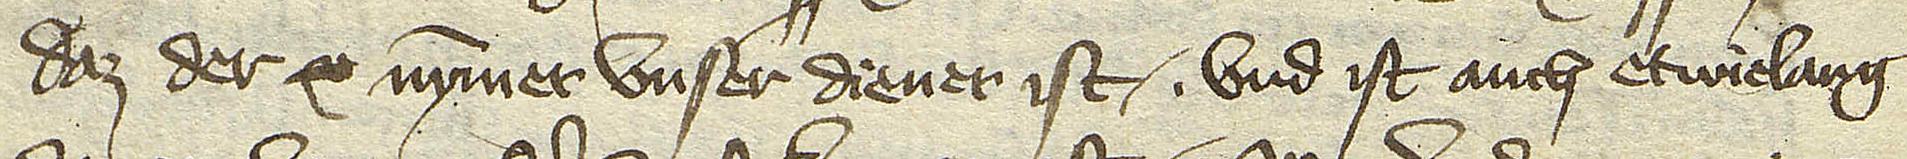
daʒ der v nymer* vnſer diener iſt / . vnd iſt auch etwielang
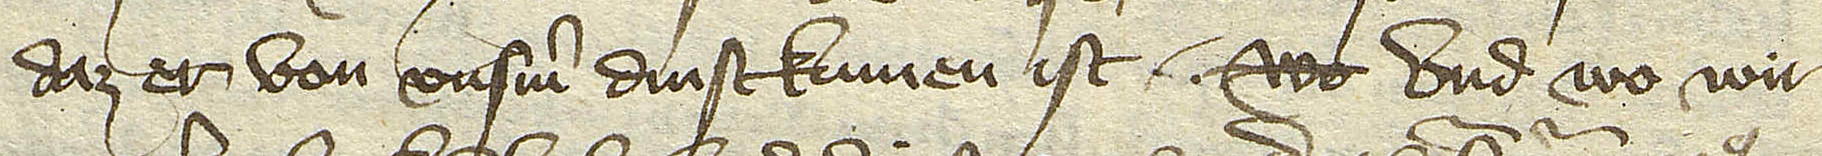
daʒ er von vnſm* dinſt kumen iſt / . wo vnd wo wir
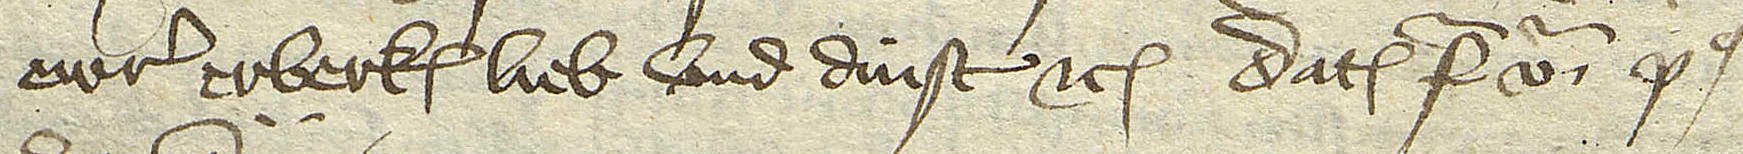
ewr* erberk* lieb vnd dinſt ec* Dat* f* v* . p*
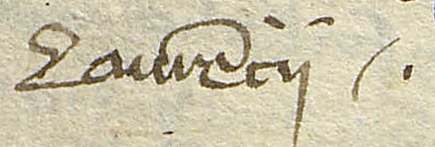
Laurecii* / .
